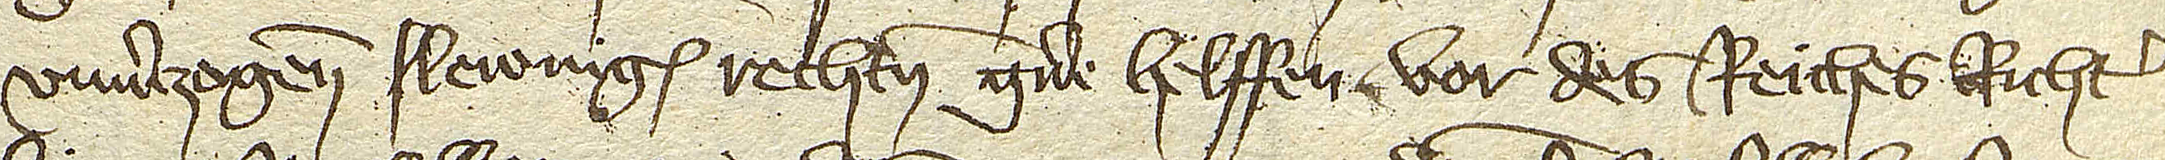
vnu*cʒogen* ſlewnig* rechtn* gn*e helffen / vor des Reiches Richt*
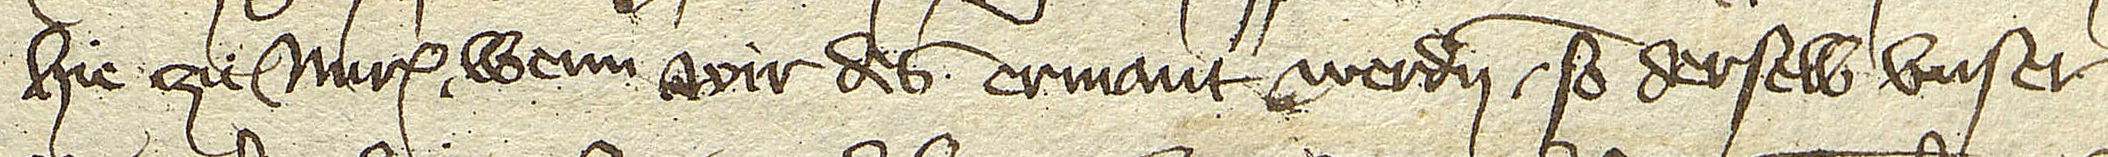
hie cʒü Nur* / wenn wir des ermant werdn* / ſo derſelb vnſer
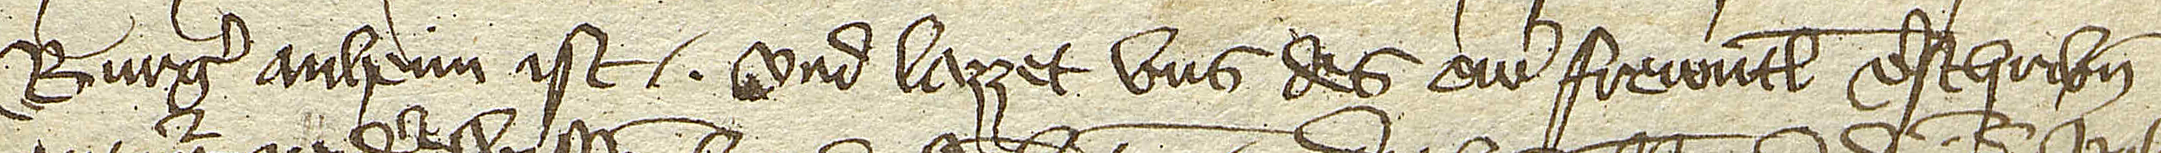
Burg* anheim iſt / . vnd laʒʒet vns des ew* frewntl* v*ſchribn*
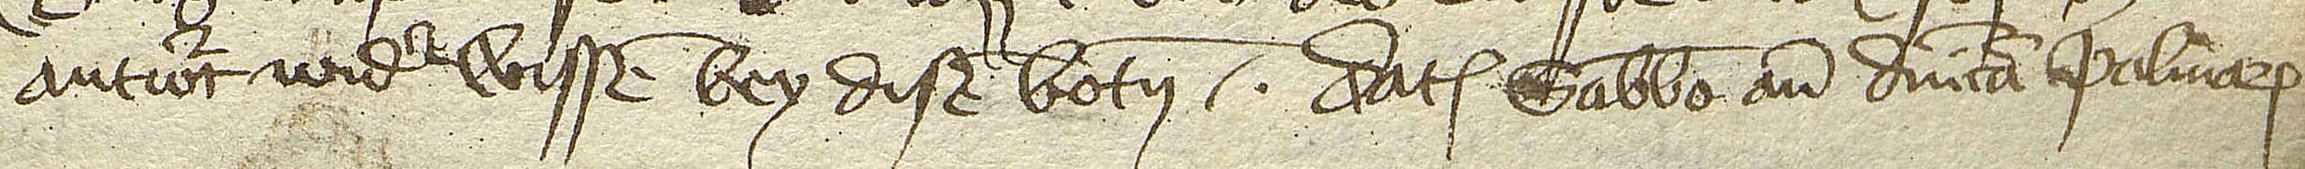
antw*t wid* wiſſe* bey diſe* botn* / . Dat* Sabbo* an* dnica* Palma*
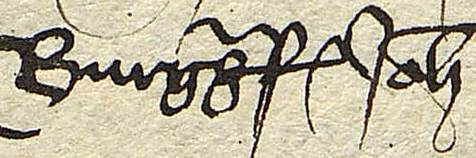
Burgg*f Ioh*
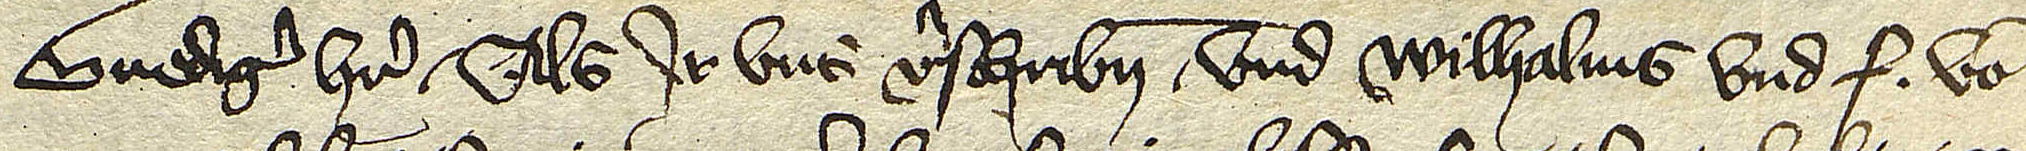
Gnedig* hr* / Als Ir vns v*ſchribn* / vnd wilhalms vnd f . vo*
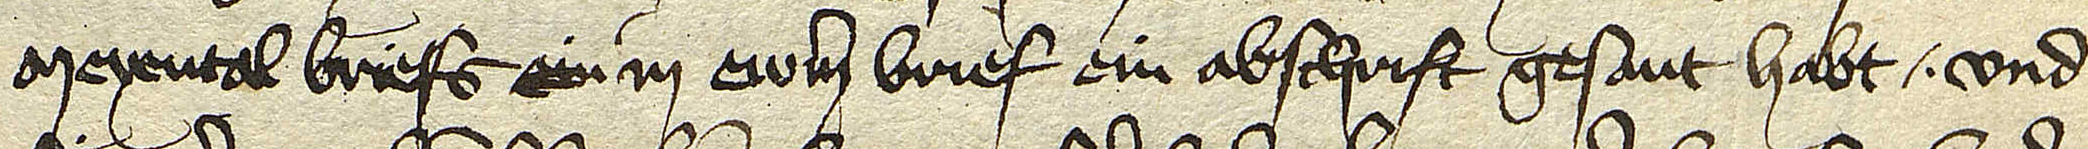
Meyental briefs ein in ewm* brief ein abſchrift geſant habt / . vnd
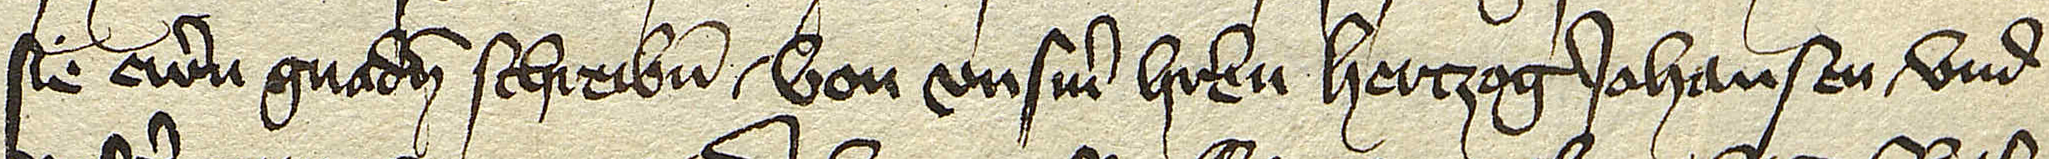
ſie ew*n gnadn* ſchreibn* / von vnſm* hr*en hercʒog Iohanſen / vnd
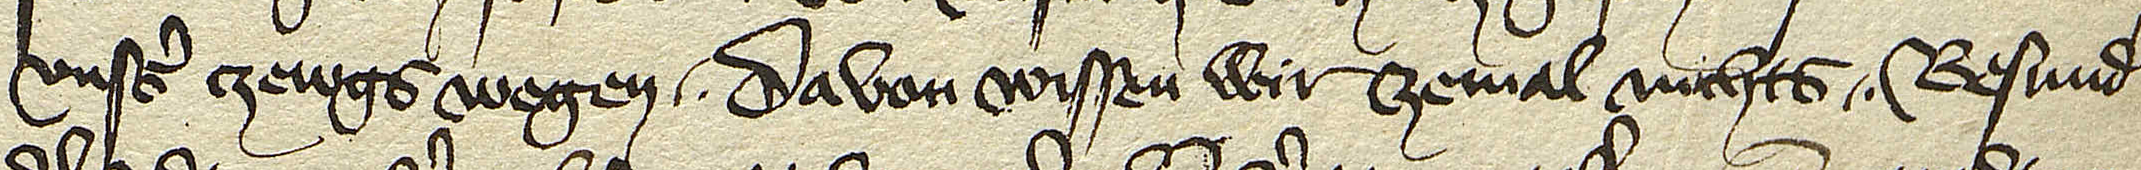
vnſs* cʒewgs wegen / . Davon wiſſen wir cʒemal nichts / . Beſund*
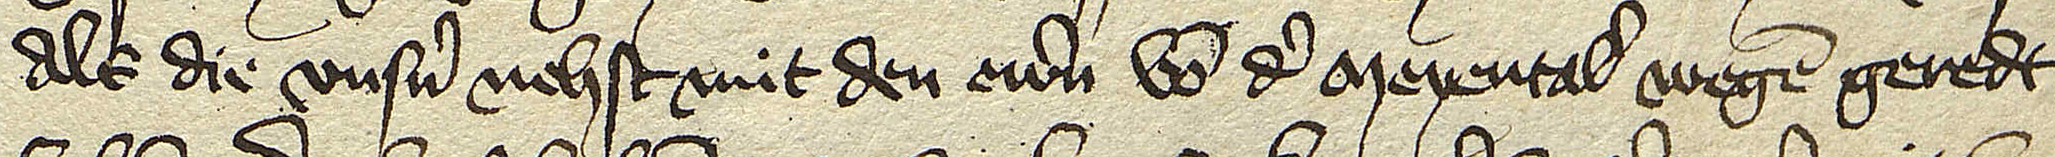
Als die vnſn* nehſt mit den ew*n vo* d* Meyental* wege* geredt
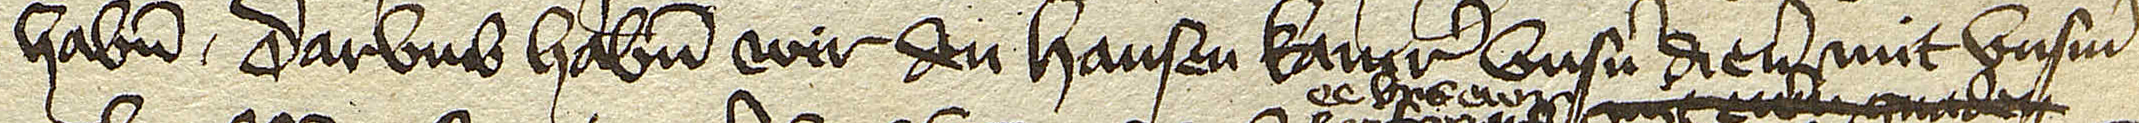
habn* / Darvmb habn* wir den hanſen kamr* vnſn* dien* mit vnſm*
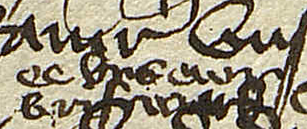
ee vns ewr
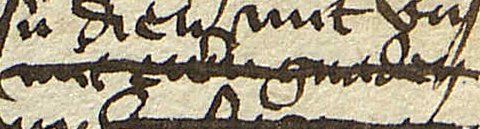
mit ewn* gnaden
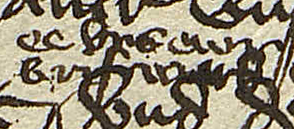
brif ward
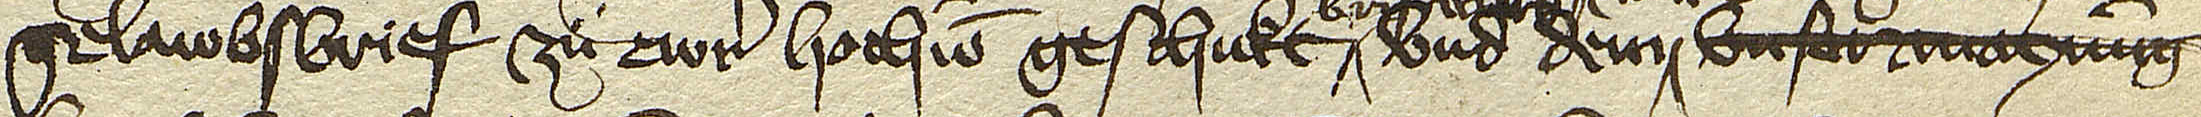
gelawbſbrief cʒü ewr* hochw* geſchickt vnd dem vnſer maynug*
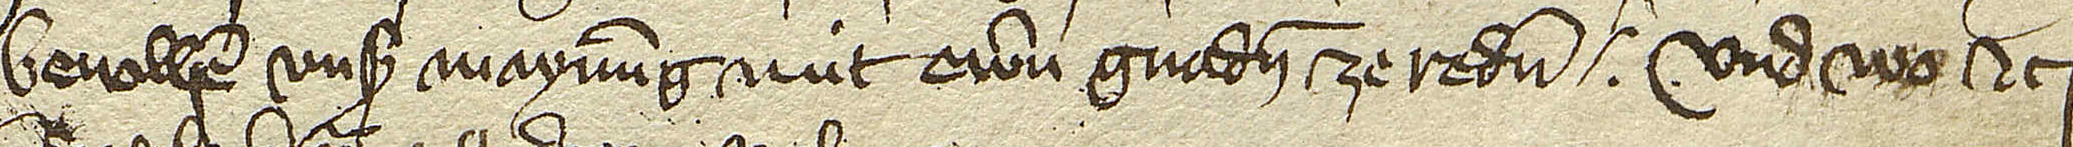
beuolhe* vnſ* maynug* mit ewn* gnadn* cʒe redn* / . vnd wo ec*
